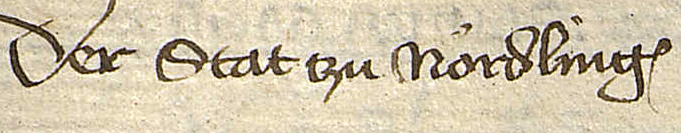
Der Stat cʒu Nördling*
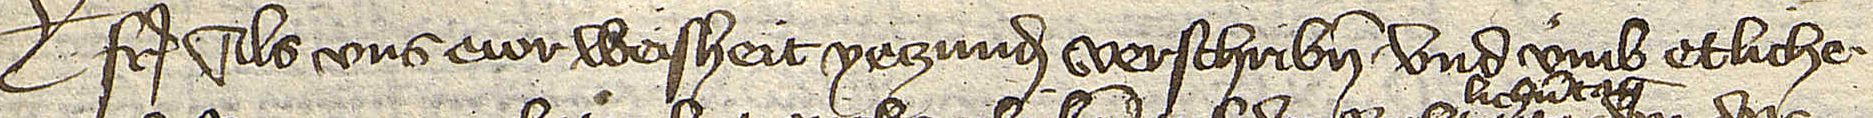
L* fr* Als vns ewr weiſheit yecʒund* verſchribn* / vnd v̈mb etliche
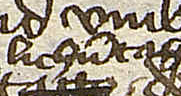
lichn* tag
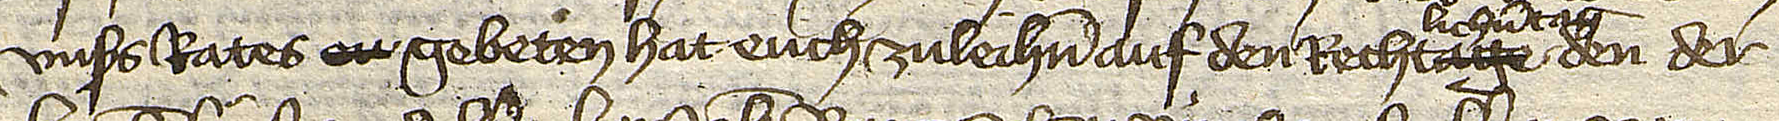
vnſ*s Rates eu gebeten hat euch ʒuleihn* auf den Rechtage den der
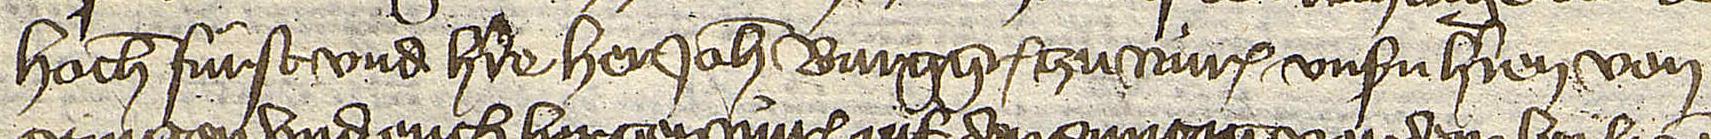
hoch* fürſt vnd h*re her Ioh* Burggr* cʒu Nür* vnſ*n h*ren von
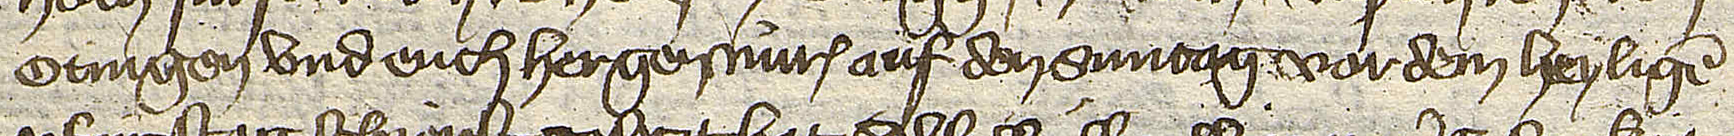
Otingen vnd euch her gen Nür* auf den Suntag vor dem heylige*
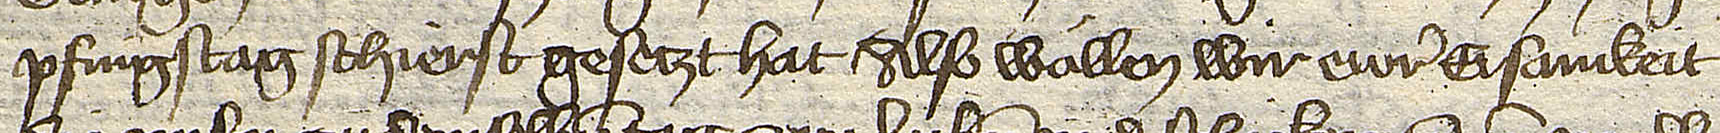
pfingſtag ſchierſt geſecʒt hat / Alſo wöllen wir ewr* Erſamkeit
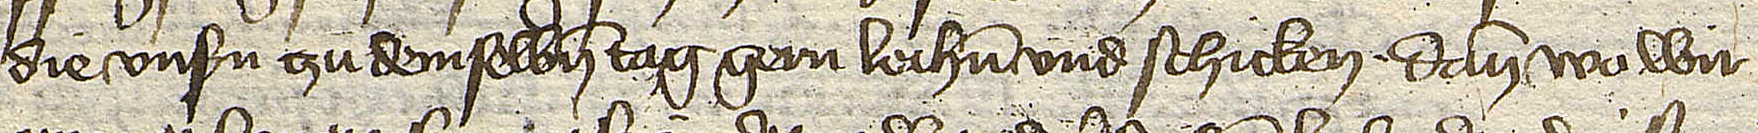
die vnſ*n cʒu demſelbn* tag gern leihn* vnd ſchicken . dan* wo wir
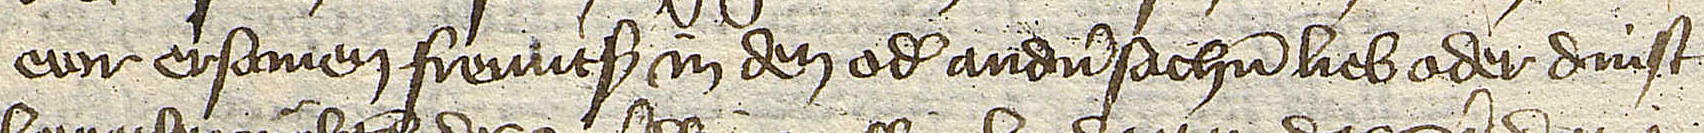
ewr erſamen freuntſ* in den od* andn* ſachn* lieb oder dinſt
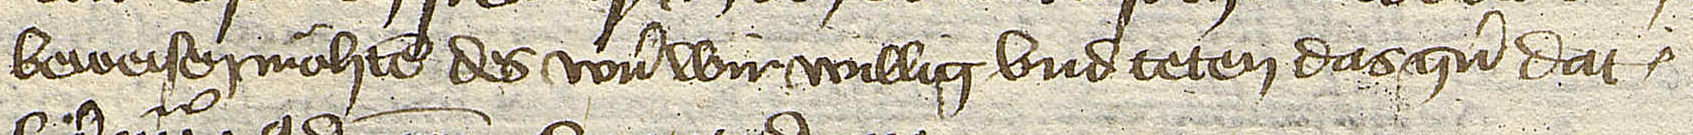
beweiſen möhte* des wn* wir willig vnd teten das gn* dat*
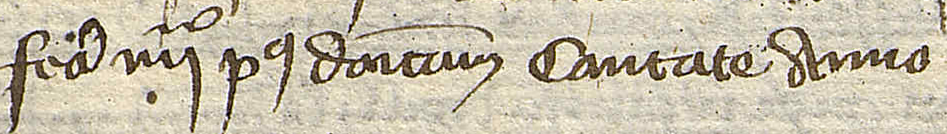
fea* iiii* p* doicam* Cantate Anno
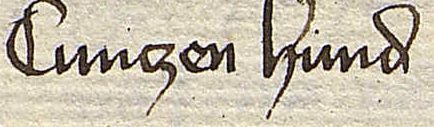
Cuncʒen hund
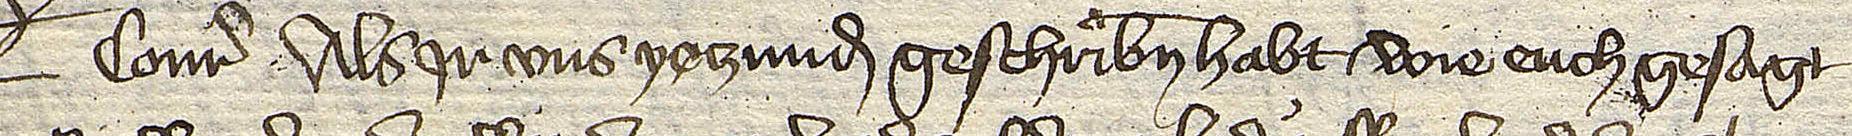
L* Conr* Als Ir vns yecʒund* geſchribn* habt / wie euch geſagt
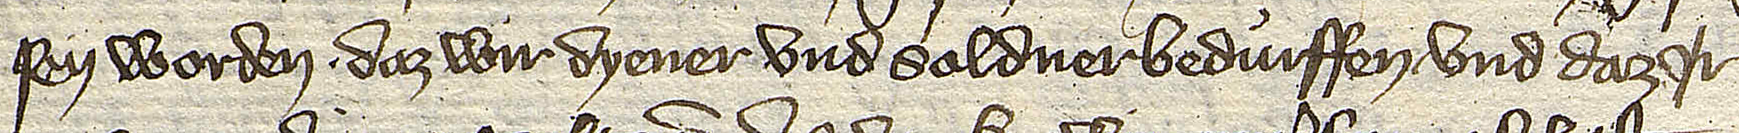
ſey worden . daʒ wir dyener vnd Soldner bedürffen / vnd daʒ Ir
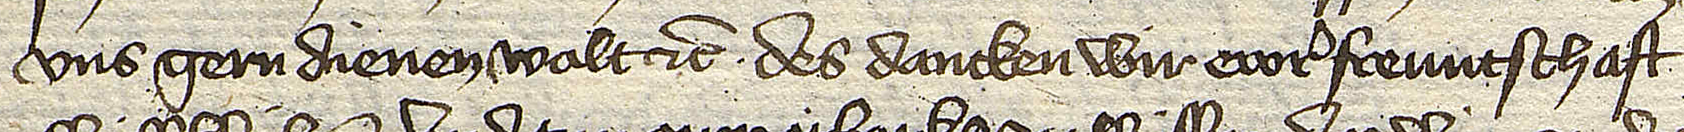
vns gern dienen wolt ec* . des dancken wir ewr* freuntſchaft
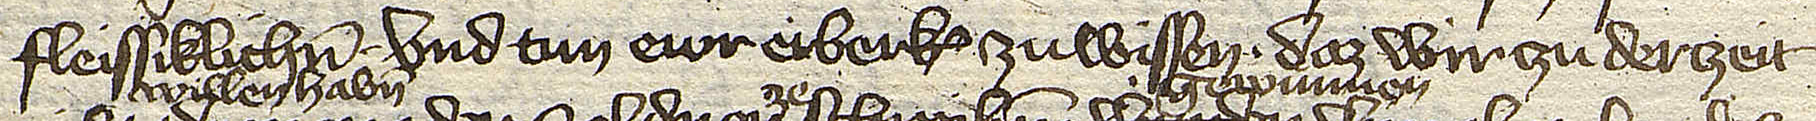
fleiſſiklichn* / vnd tun ewr erberk* cʒu wiſſen . daʒ wir cʒu dercʒeit
